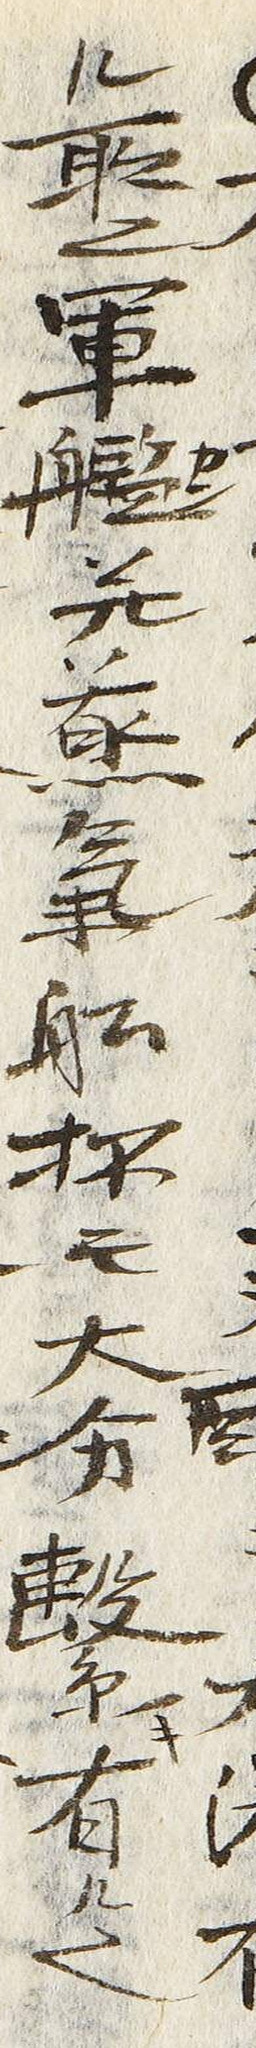ル所也軍艦并蒸気船抔モ大分繋キ有ル也
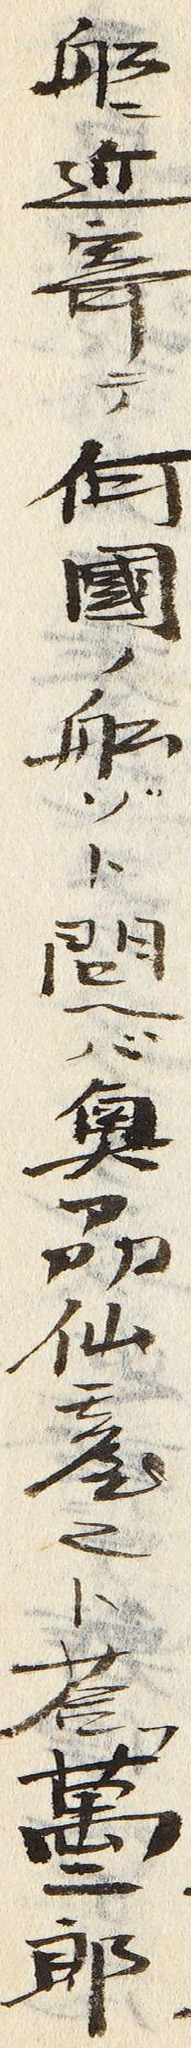船ニ近寄テ無何国ノ船ゾト問ヘバ奥州仙台也ト答フ萬二郎
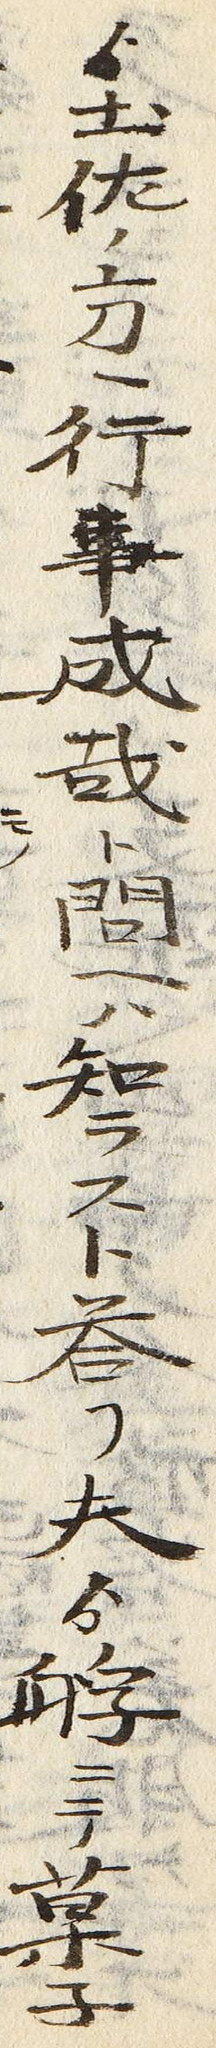ゟ土佐ノ方ヘ行事成哉ト問ヘハ知シラスト答ウ夫ゟ艀ニテ菓子
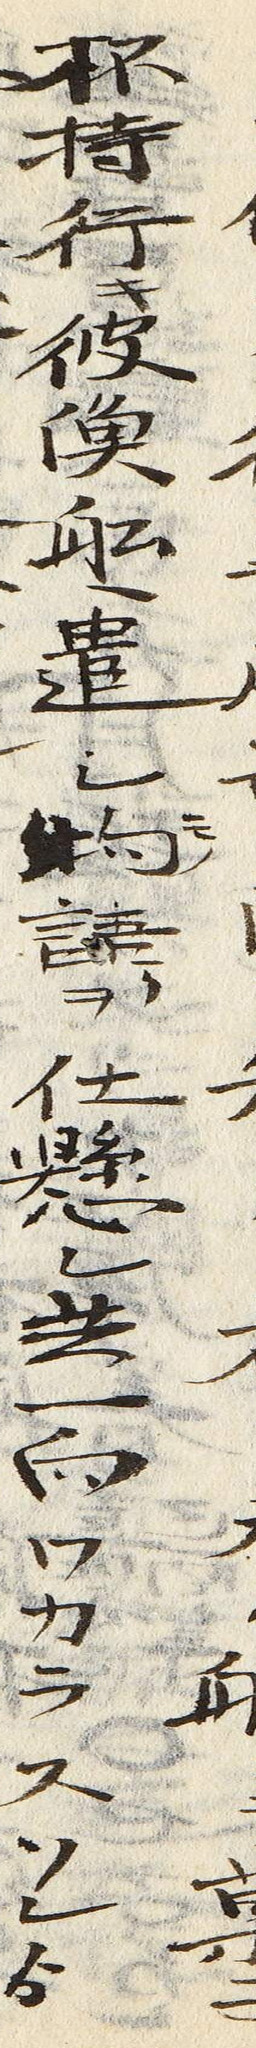抔持行キ彼漁船ヘ遣シ物語リヲ仕懸シ共一向ワカラスソレゟ
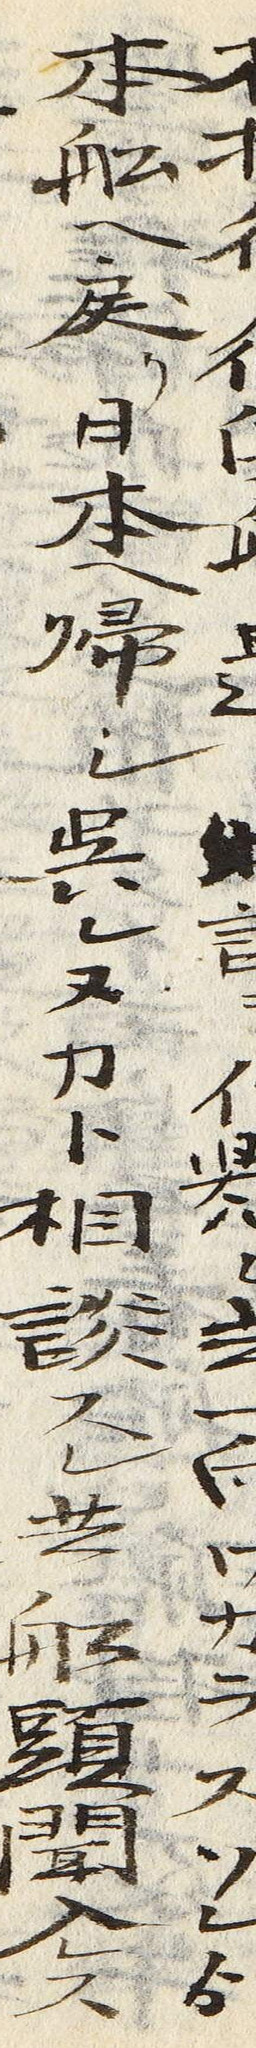本船ヘ戻リ日本ヘ帰シ呉レヌカト相談スレ共船頭聞入レス
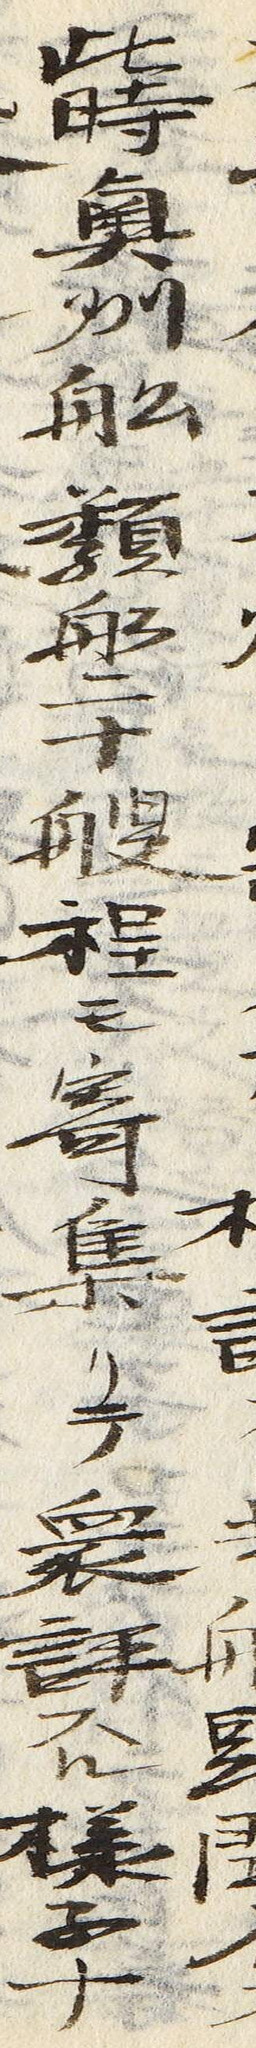此時奥州船類船二十艘程モ寄集リテ衆評スル様子ナ
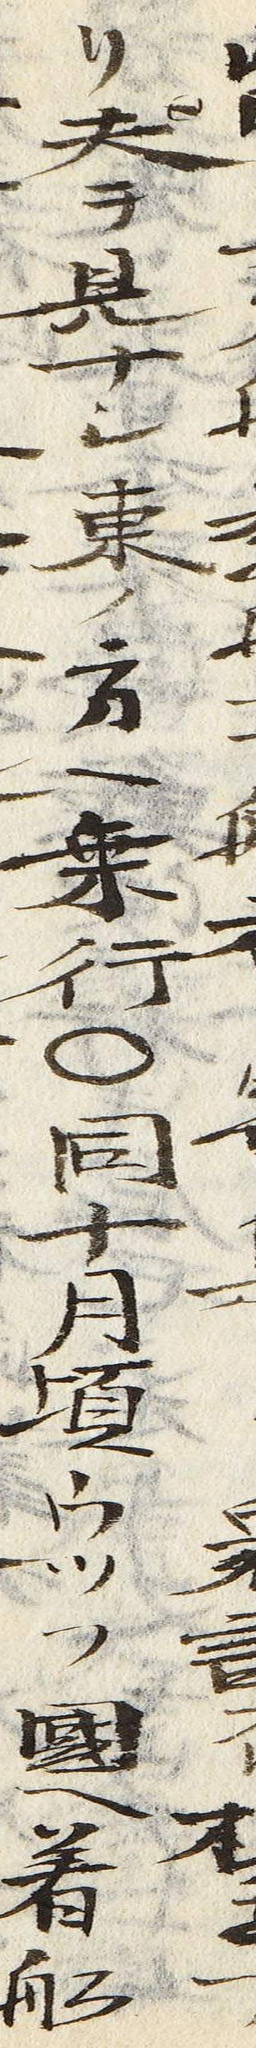リ夫ヲ見ナシ東ノ方ヘ乗行〇同十月頃ウツフ国ヘ着船
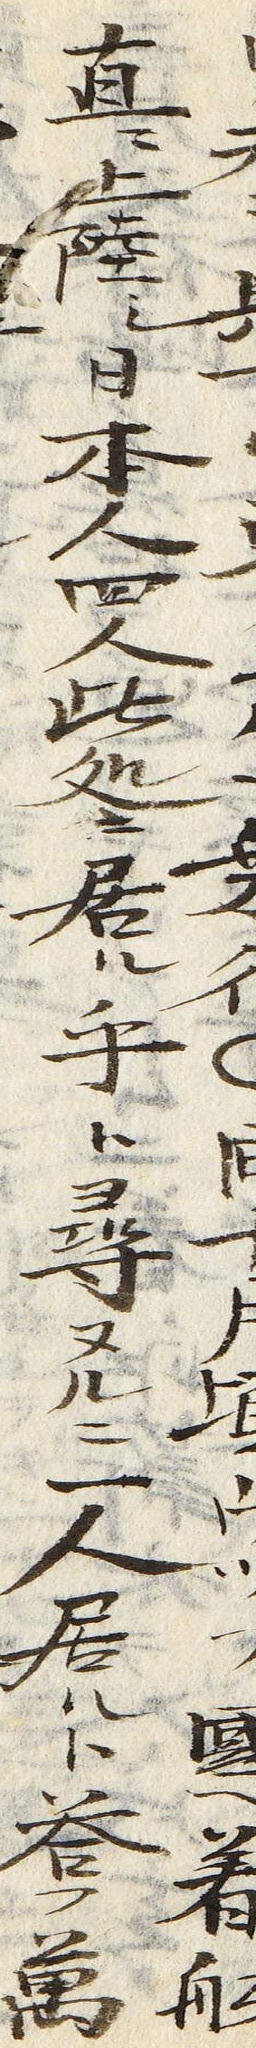直ニ上陸シ日本人四人此処ニ居ル乎ト尋ヌルニ一人居ルト答フ萬
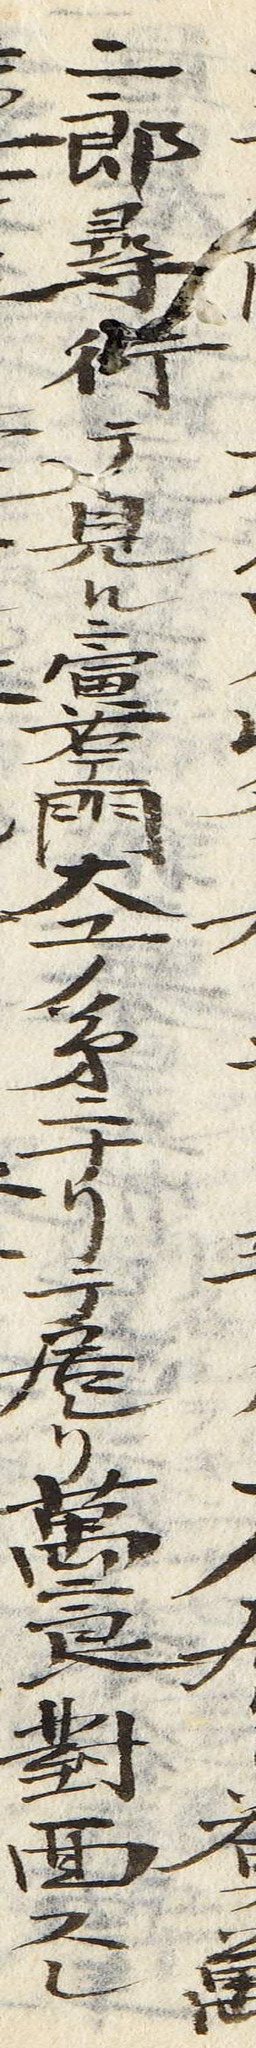二郎尋行テ見ルニ寅右衛門大工ノ弟ニナリテ居リ萬二良対面スレ
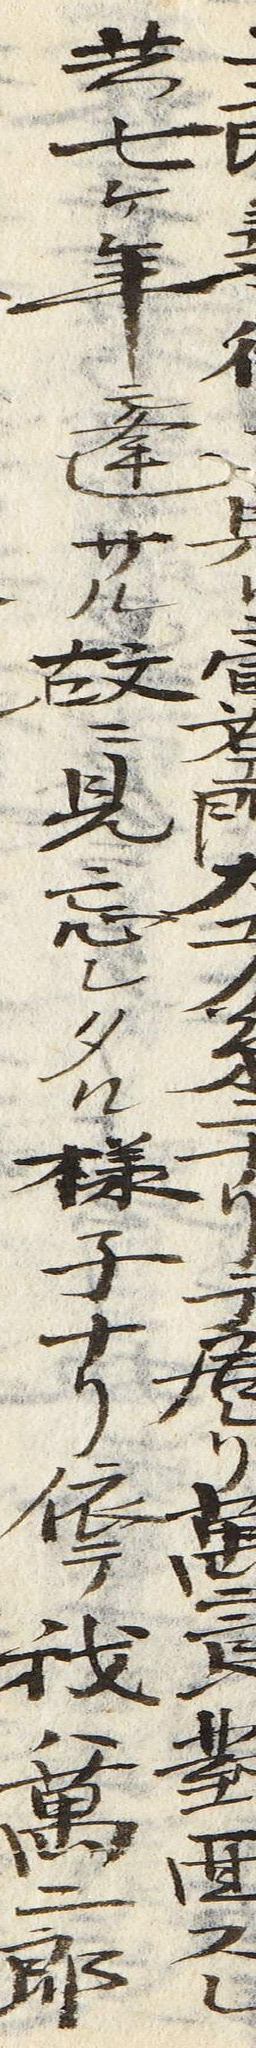共七ケ年逢サル故ニ見忘レタル様子ナリ依テ我ハ萬二郎
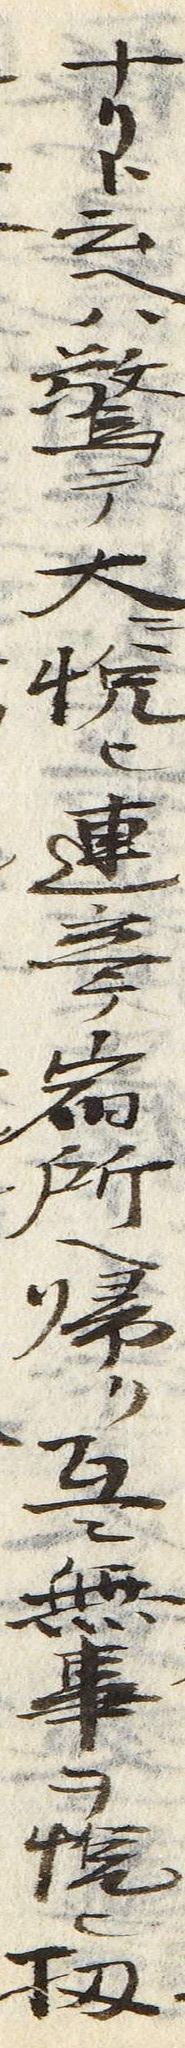ナリト云ヘハ驚テ大ニ悦ヒ連立テ宿所ヘ帰リ互ニ無事ヲ悦ヒ扨
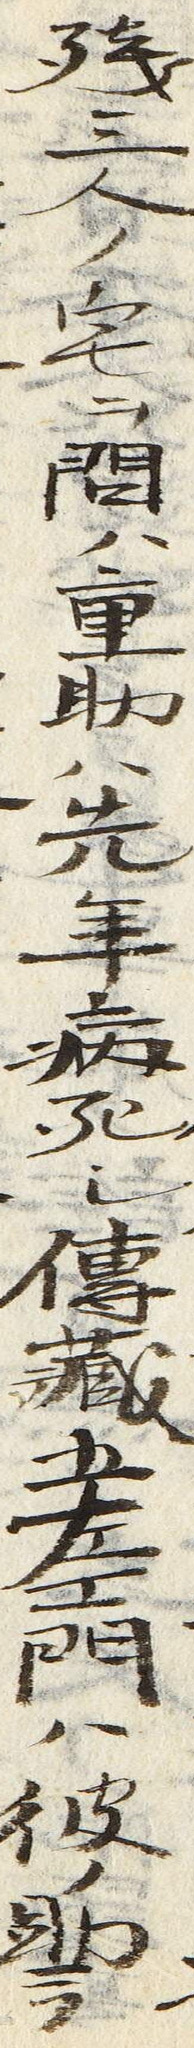残三人ノ宅ヲ問ハ重助ハ先年病死シ傳蔵五左衛門ハ彼ノ助
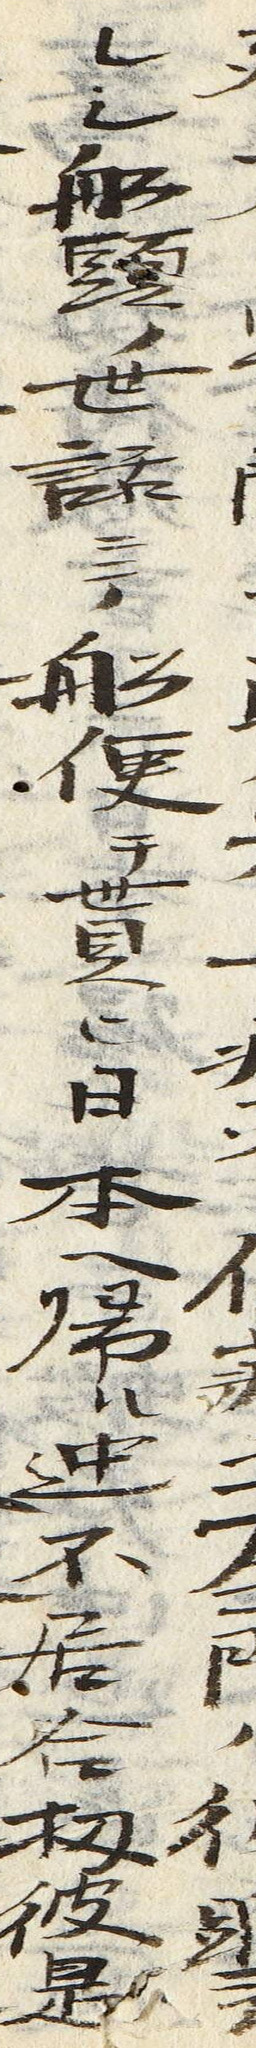レシ船頭ノ世話ニテ船便ヲ貰ヒ日本ヘ帰ル迚不居合扨彼是
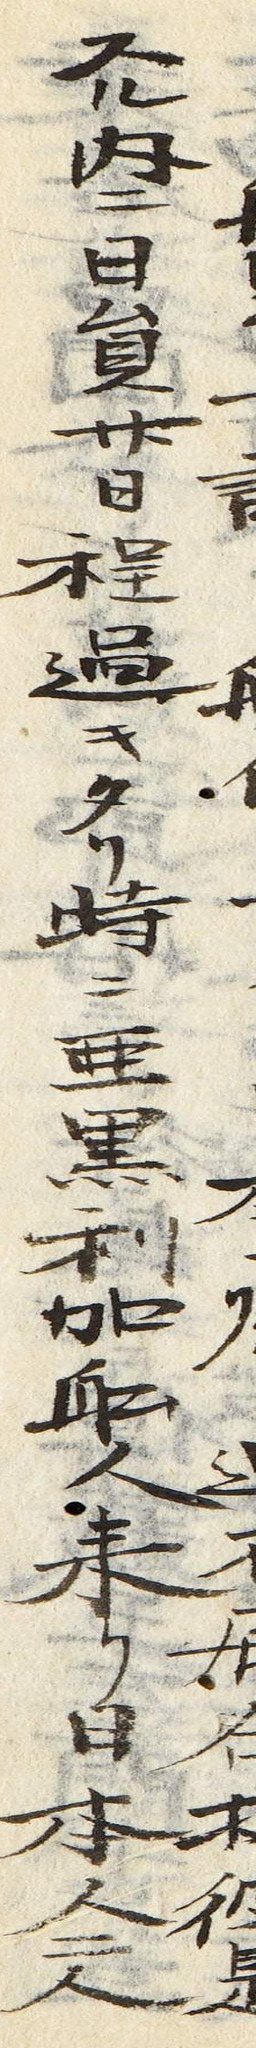スル内ニ日員廿日程過キタリ時ニ亜墨利加船人来リ日本人二人

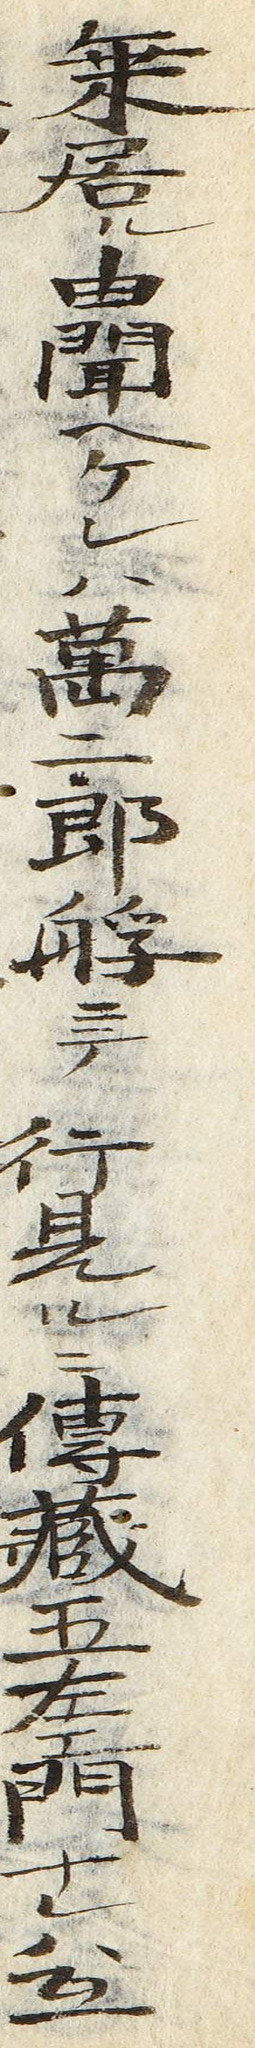乗居ル由聞へケレハ萬二郎艀ニテ行見ルニ傳蔵五左衛門ナレハ互
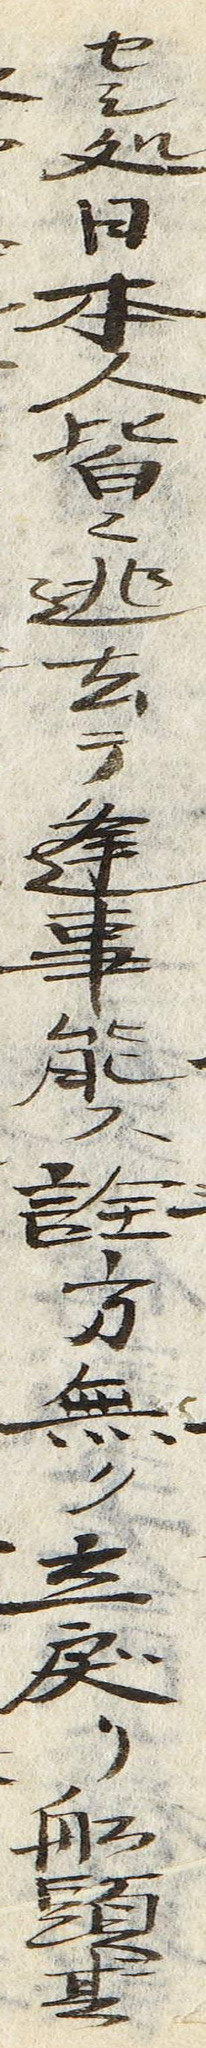セシ処日本人皆々逃去テ逢事能ス詮方無ク立戻リ船頭其
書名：漂流記聞
